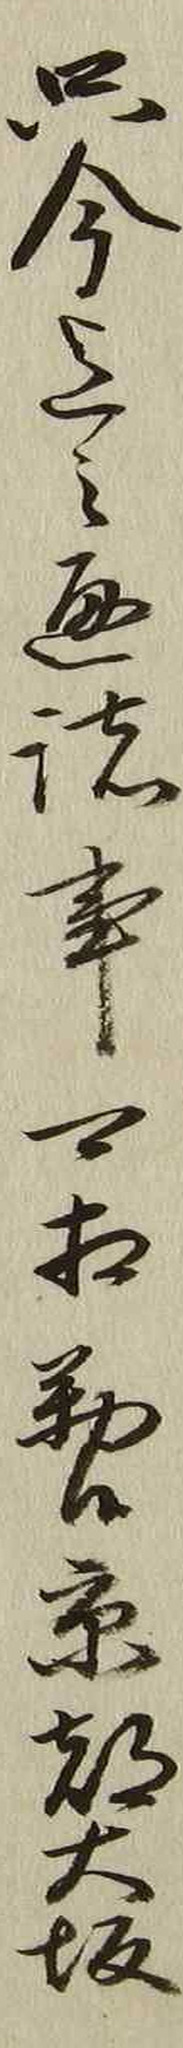只今迄之通諸事可相勤候京都大坂
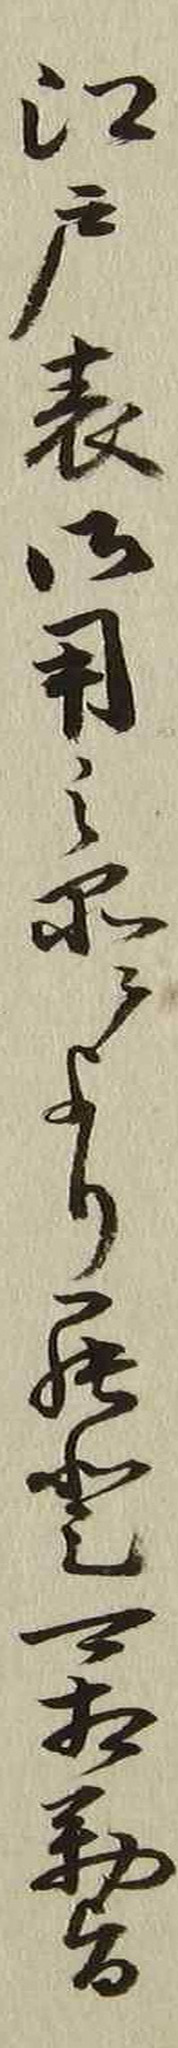江戸表御用之品々より罷登可相勤旨
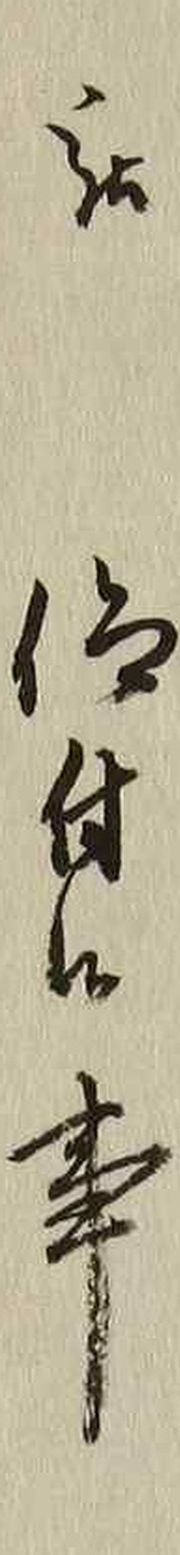被仰出候事
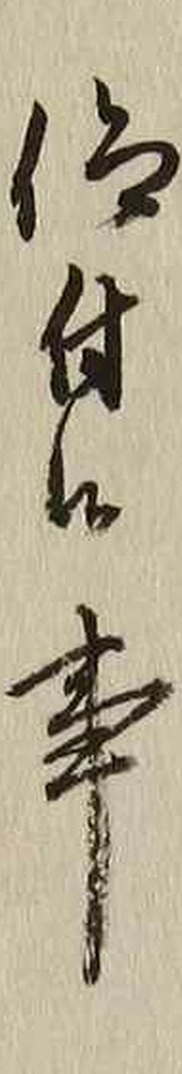仰聞候事
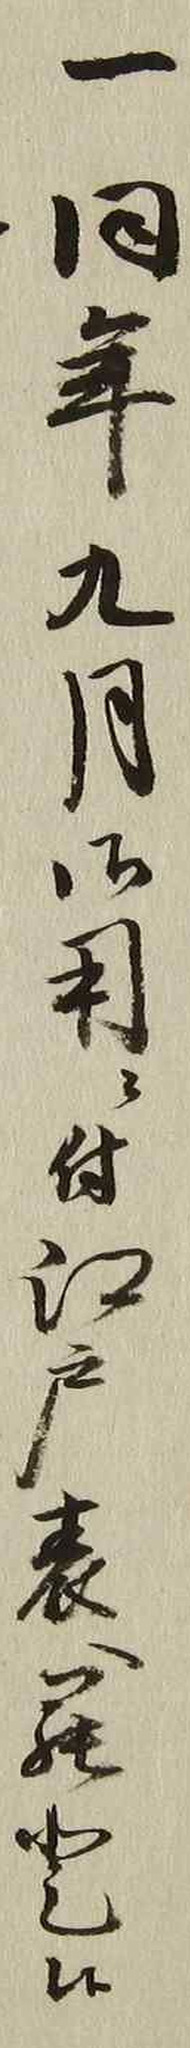一同年九月御用ニ付江戸表へ罷登候
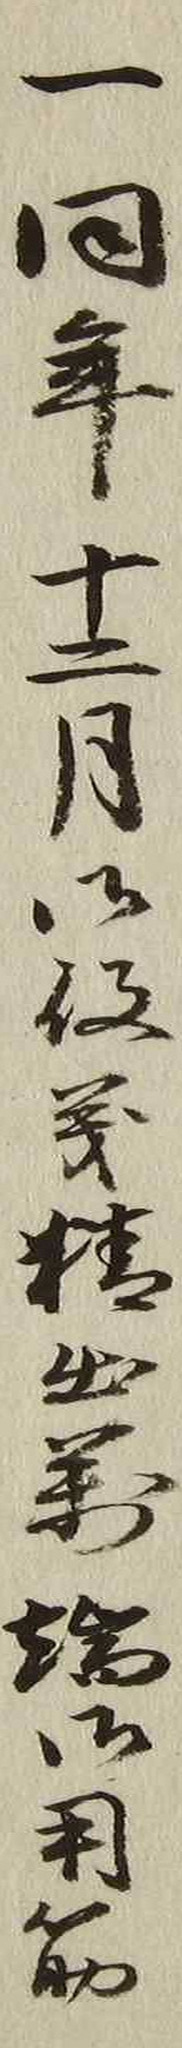一同年十二月御役義精出万端御用筋
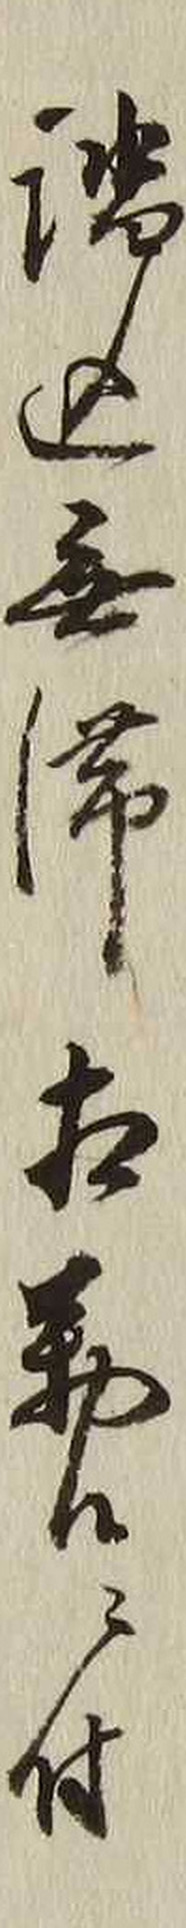踏込無滞相勤候ニ付
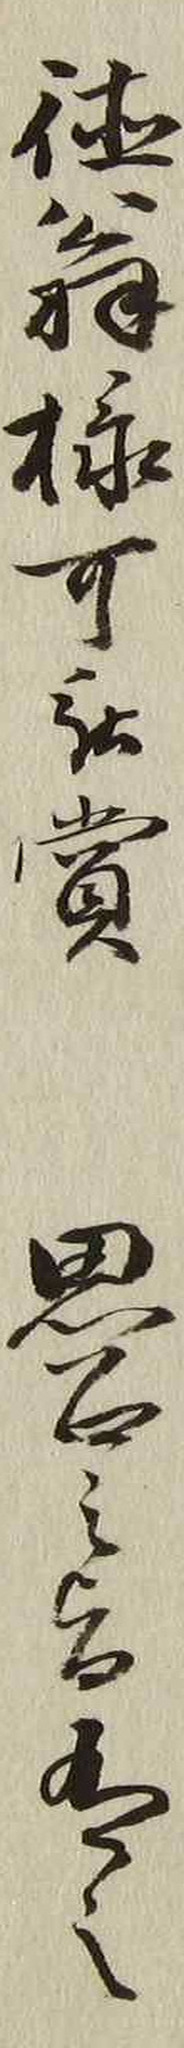徳翁様可被賞思召之旨有之
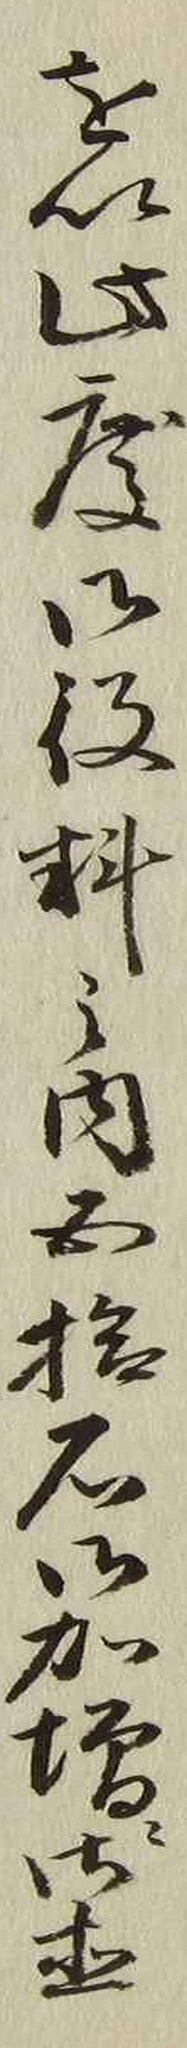を以此度御役料之内五拾石御加増ニ御直
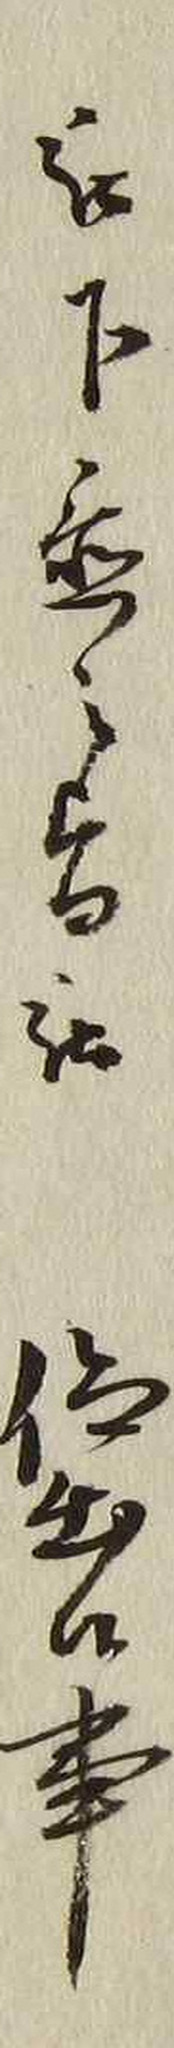被下置之旨被仰出候事
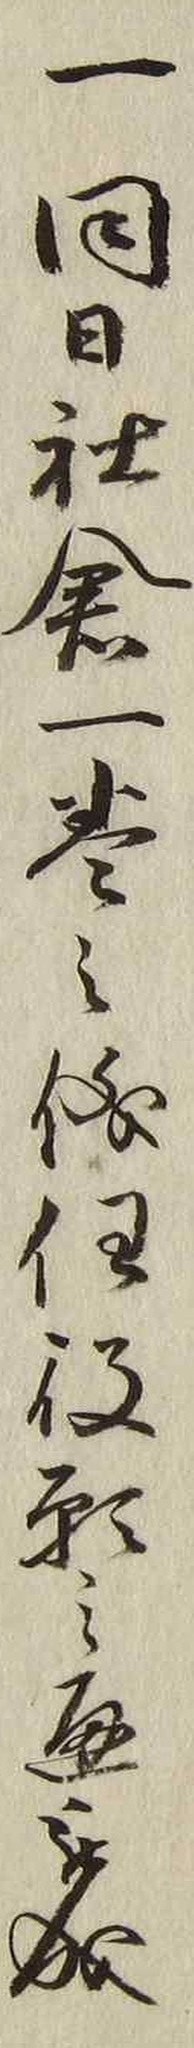一同日社倉一巻之儀任役願之通被成
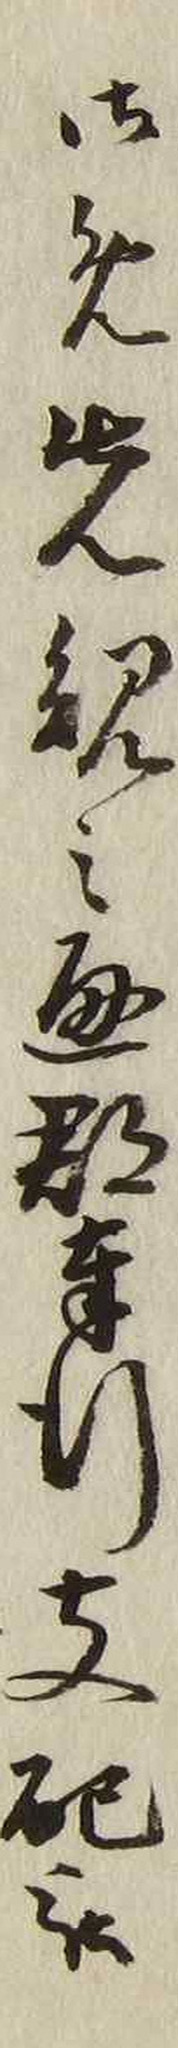御免先規之通郡奉行支配被
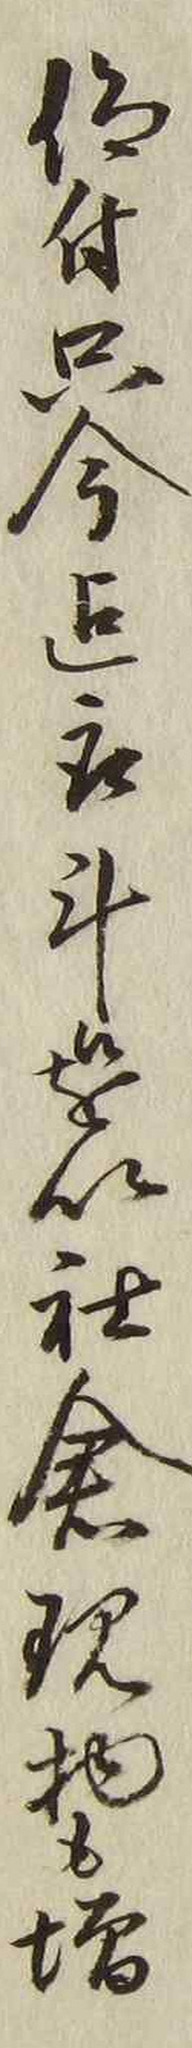仰付只今迄取計候を以社倉現物も増

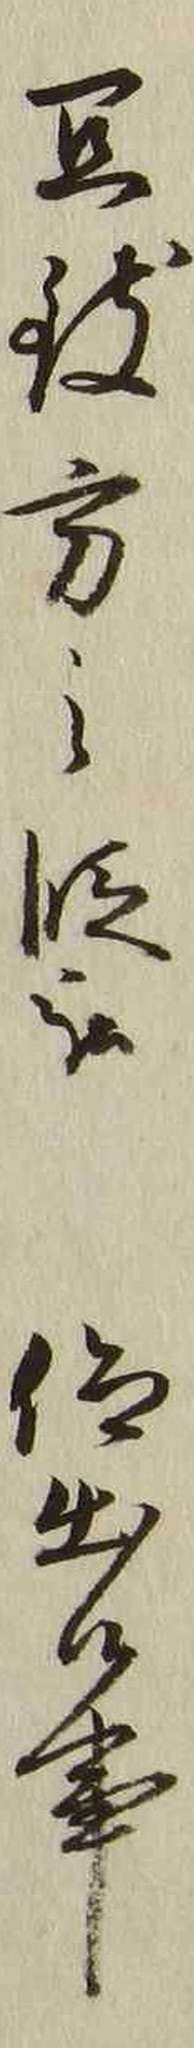宜致方之段被仰出候事
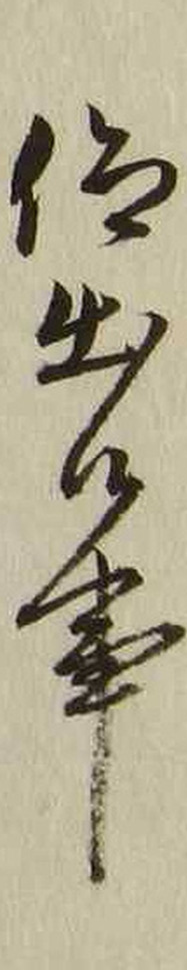仰出候事
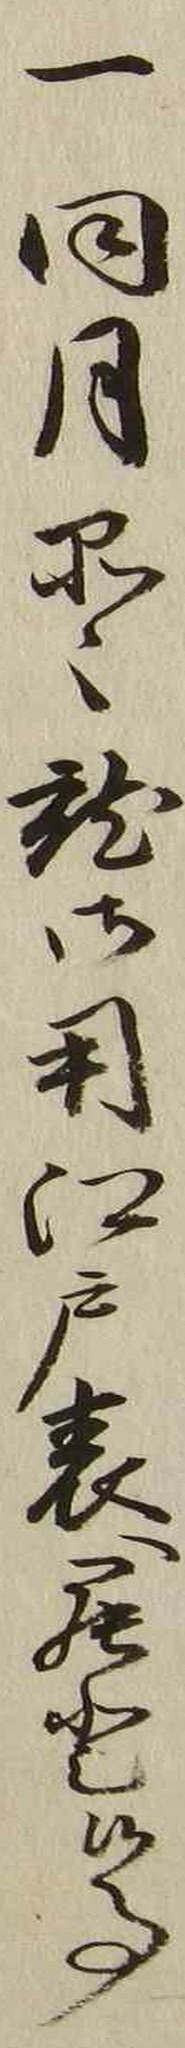一同月品々就御用江戸表へ罷登候事
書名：諸士系譜　巻之61　と之部4
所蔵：会津若松市立会津図書館
